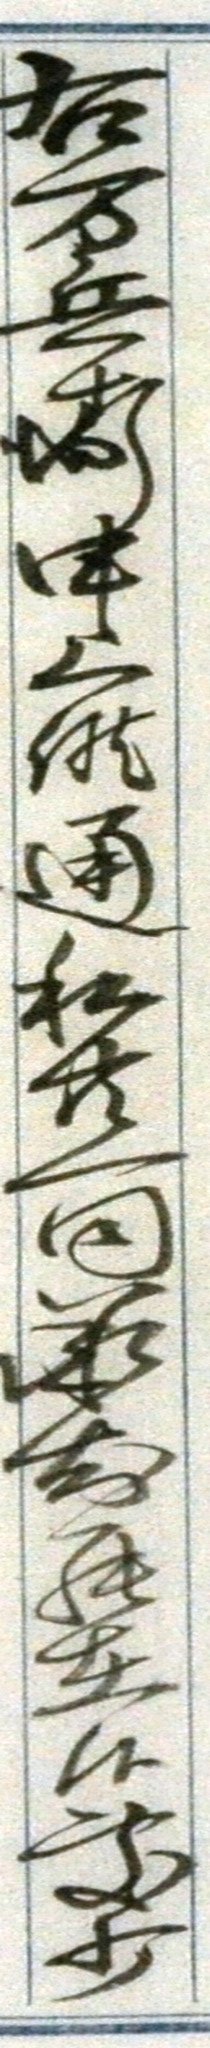右万兵衛申上候通私共一同承知罷在候処少
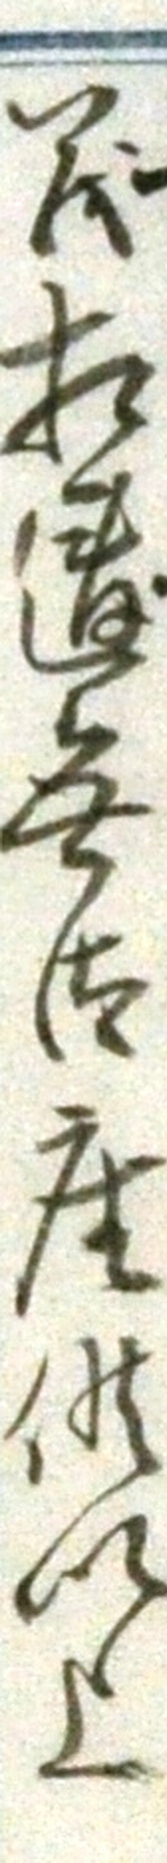も相違無御座候以上
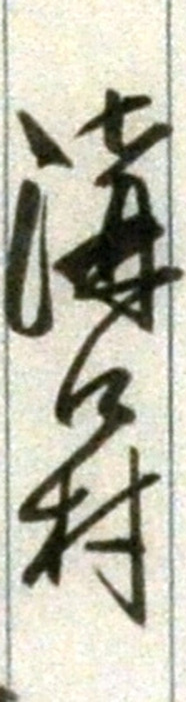溝口村
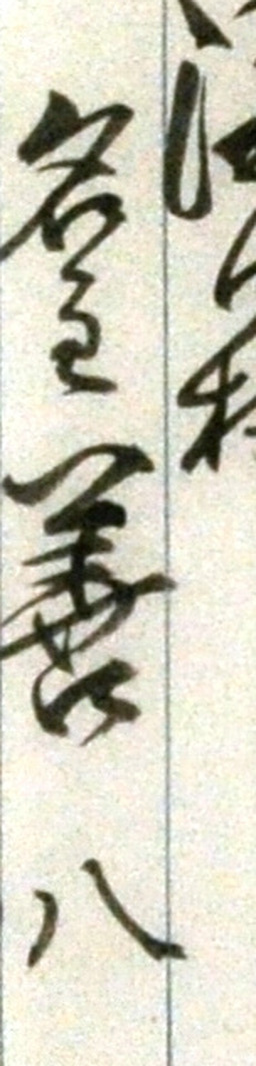名主善八
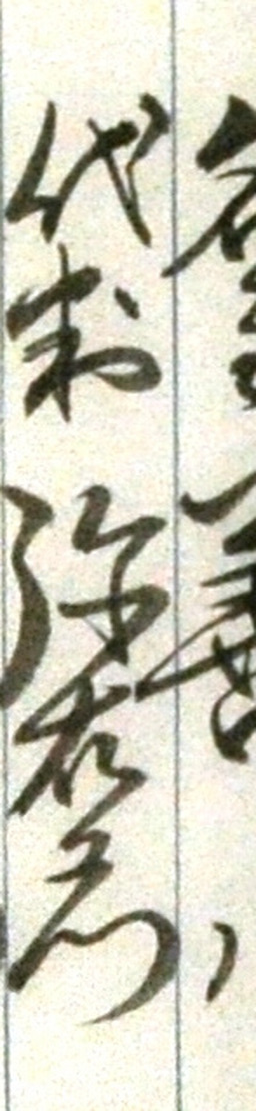代判弥右衛門
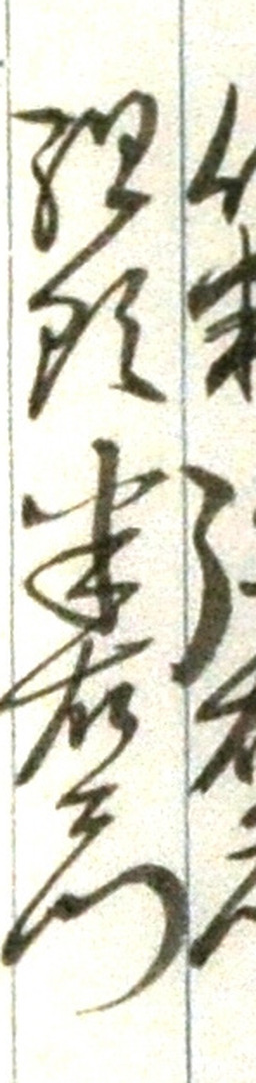組頭半右衛門

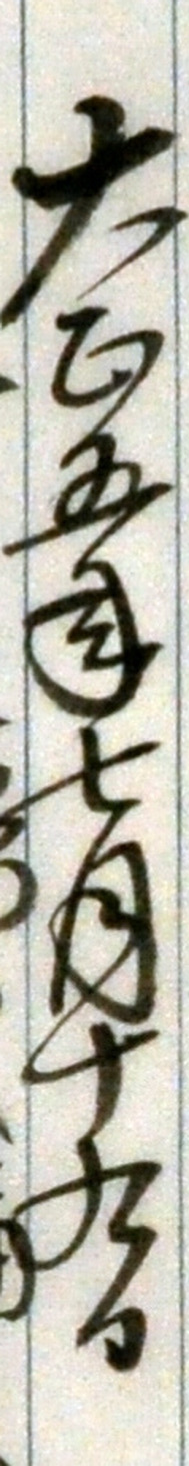大正五年七月十九日
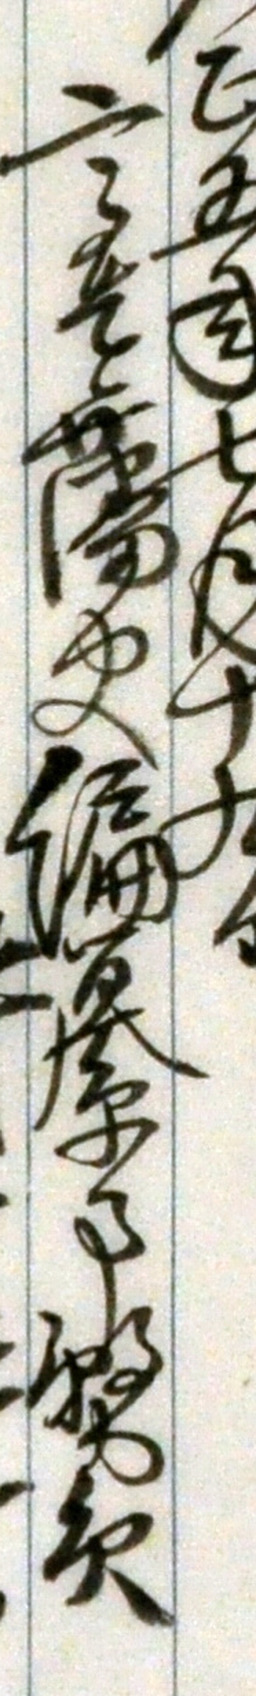高遠藩史編纂事務員
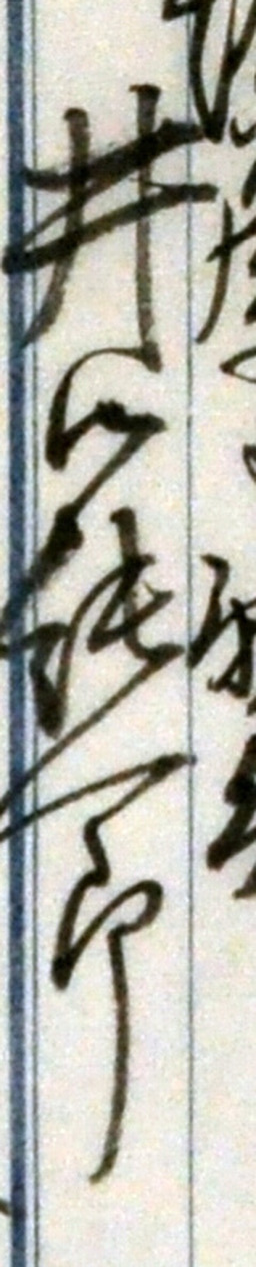井口純一郎
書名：贋金之儀ニ付御尋之答
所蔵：伊那市立高遠町図書館・合同会社AMANE
